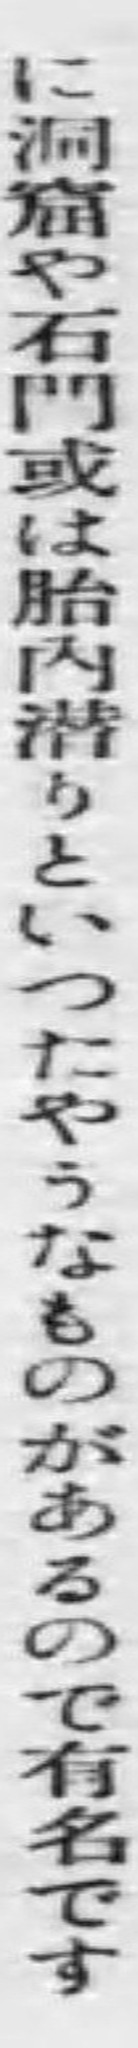に洞窟や石門或は胎内潜りといつたやうなものがあるので有名です
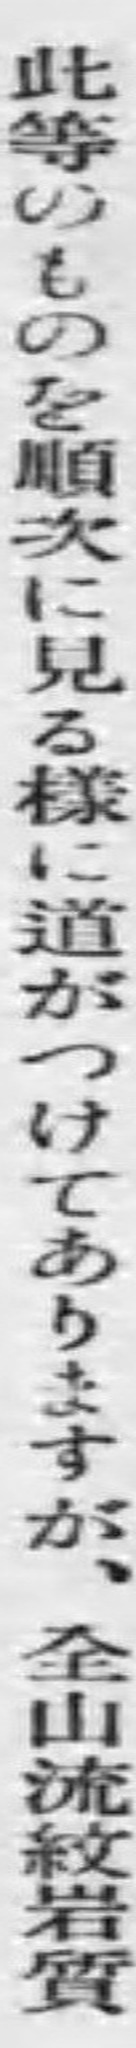此等のものを順次に見る樣に道がつけてありますが、全山流紋岩質
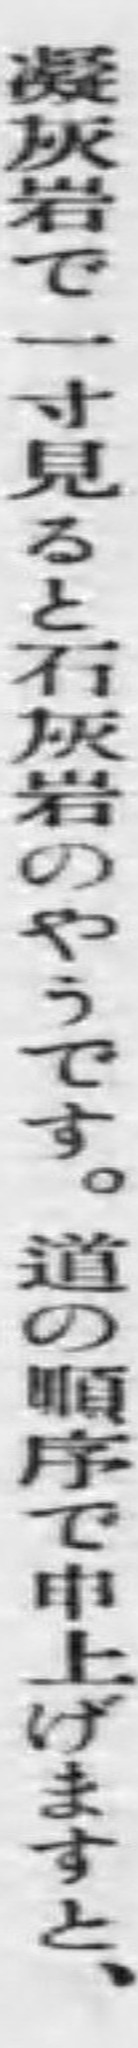凝灰岩で一寸見ると石灰岩のやうです。道の順序で申上げますと、
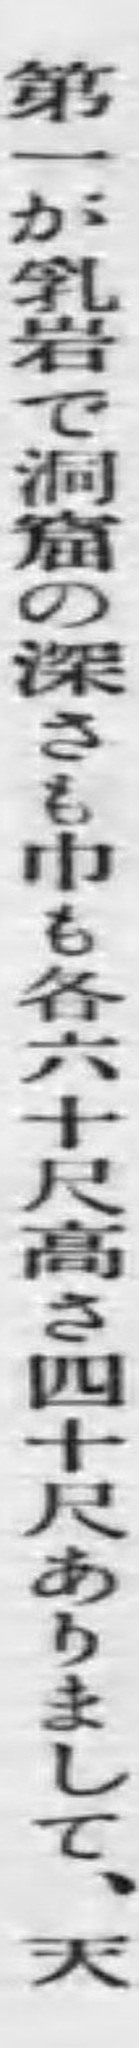第一が乳岩で洞窟の深さも巾も各六十尺高さ四十尺ありまして、天
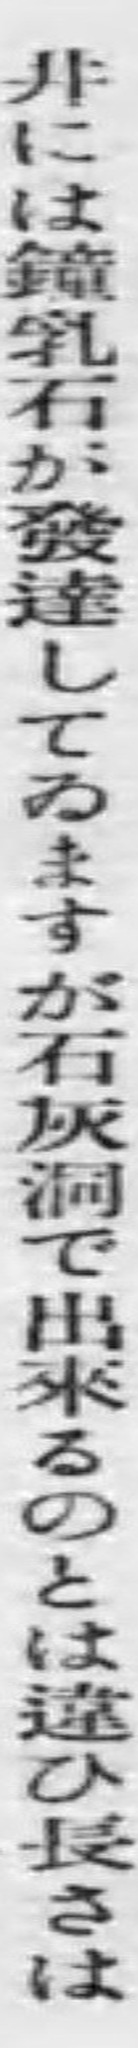井には鐘乳石が發達してゐますが石灰洞で出來るのとは違ひ長さは
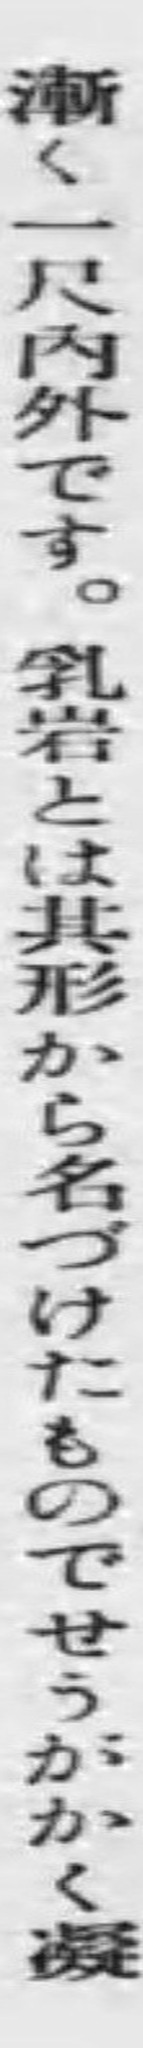漸く一尺内外です。乳岩とは其形から名づけたものでせうがかく凝
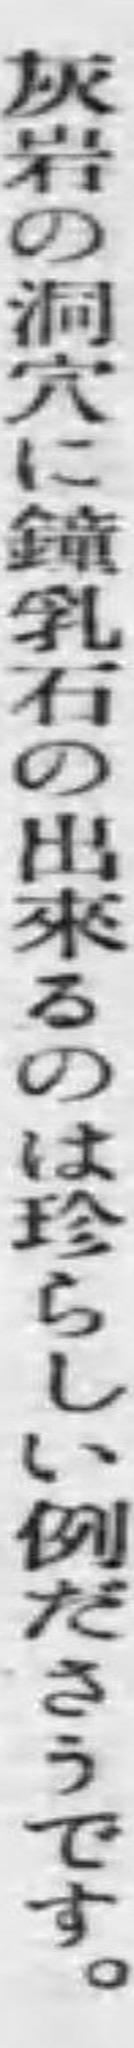灰岩の洞穴に鐘乳石の出來るのは珍らしい例ださうです。
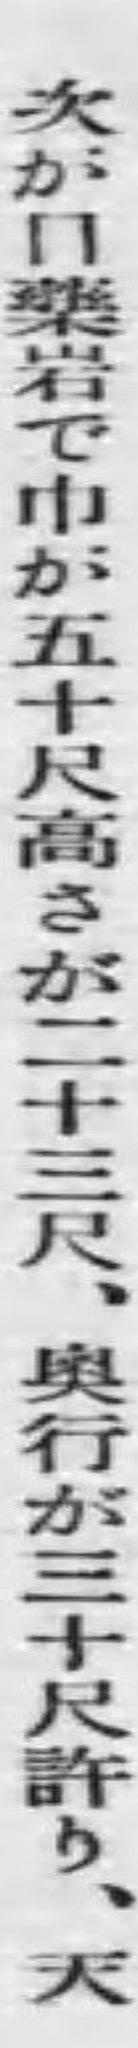次が目藥岩で巾が五十尺高さが二十三尺、奥行が三十尺許り、天
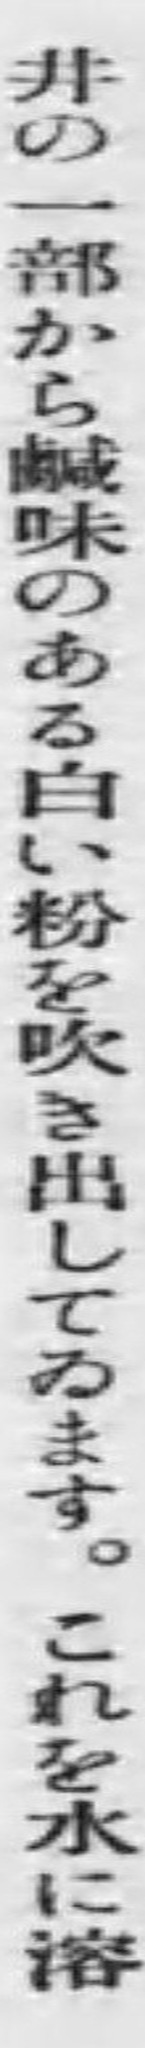井の一部から鹹味のある白い粉を吹き出してゐます。これを水に溶
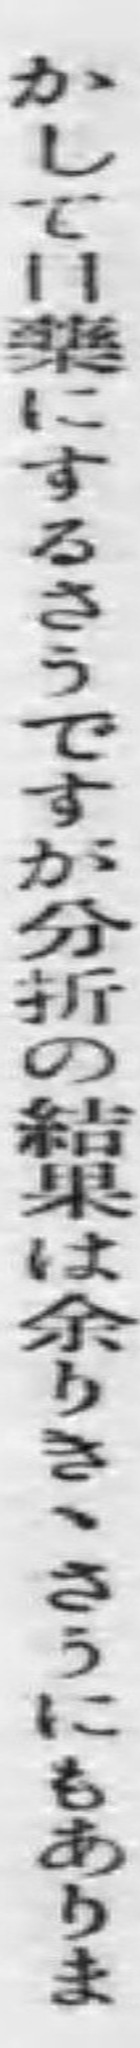かして目藥にするさうですが分折の結果は余りきヽさうにもありま
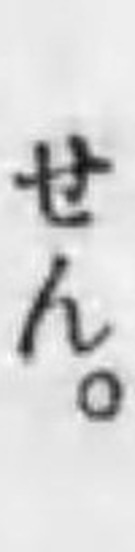せん。
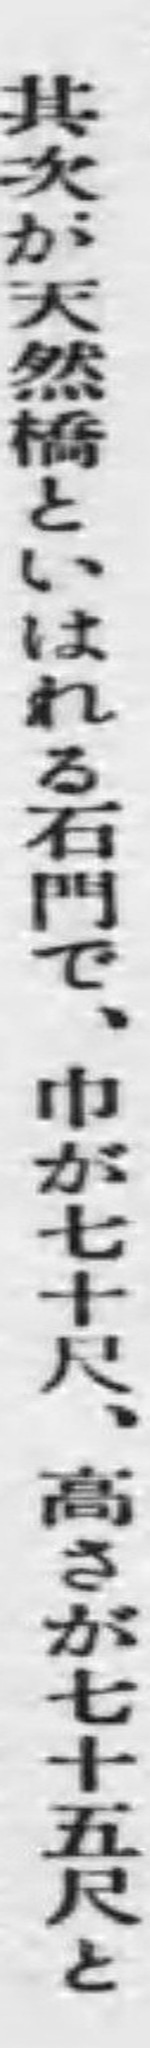其次が天然橋といはれる石門で、巾が七十尺、高さが七十五尺と
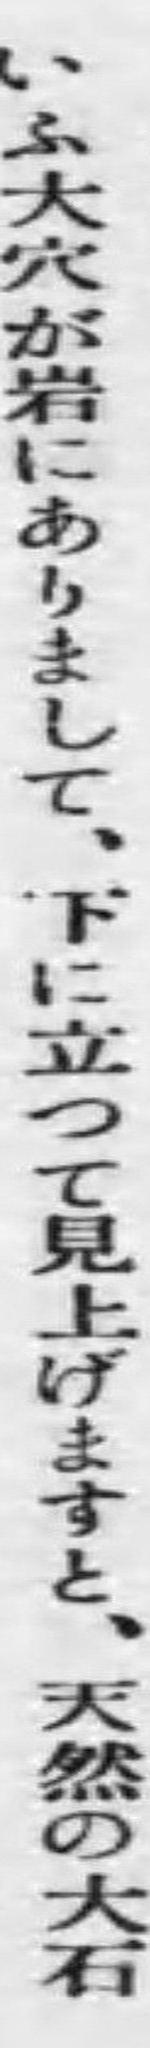いふ大穴が岩にありまして、下に立つて見上げますと、天然の大石
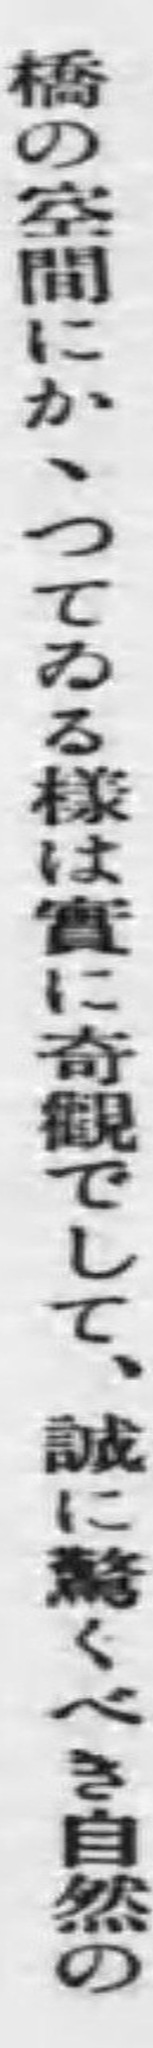橋の空間にかヽつてゐる樣は實に奇觀でして、誠に驚くべき自然の
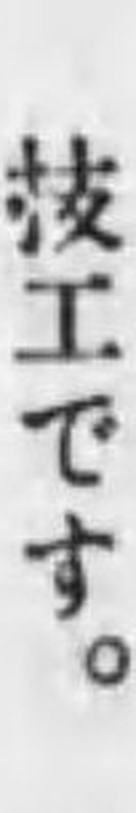技工です。
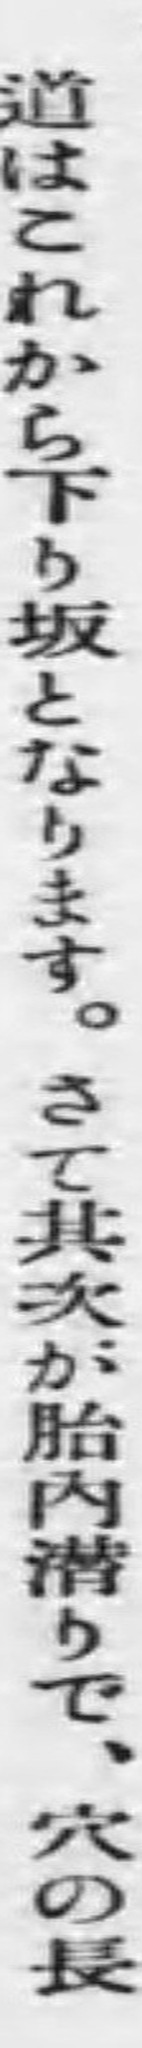道はこれから下り坂となります。さて其次が胎内潜りで、穴の長
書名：東三河道中記 : 豊橋市及其附近案内
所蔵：国立国会図書館 National Diet Library, JAPAN
